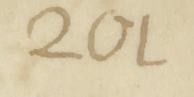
201
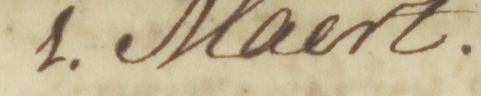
1. Maert.
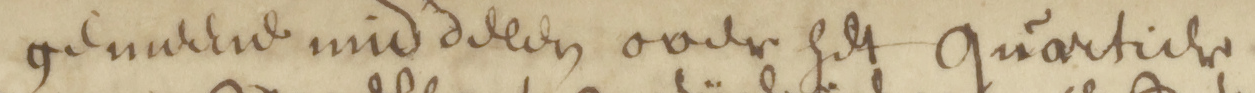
gemeene middelen over het Quartier
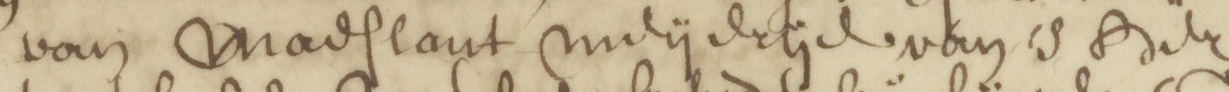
van Maeslant meijerije van ‛s Her„
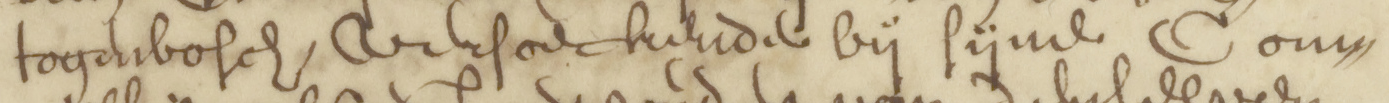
togenbosch, versoeckende bij sijne Com„
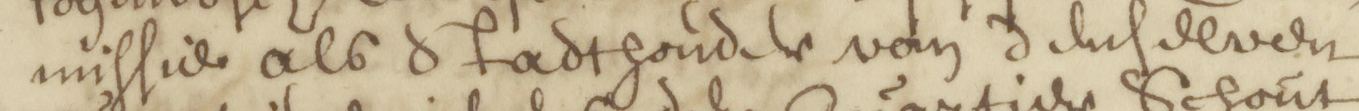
missie als Stadthouder van denselven
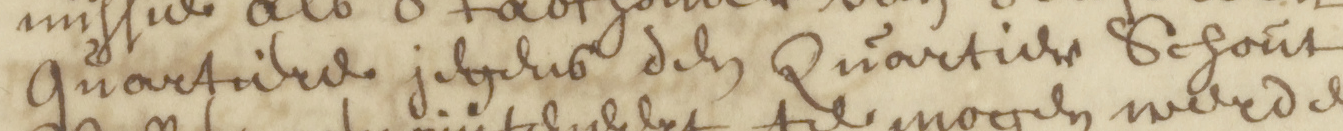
Quartiere jegens den Quartier Schout
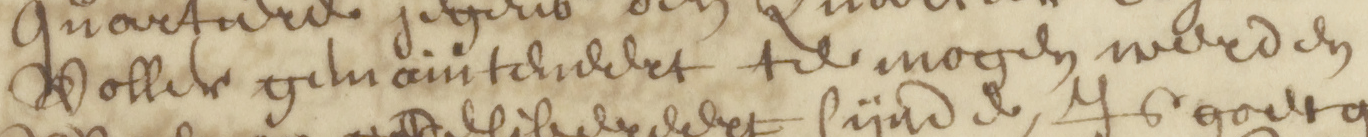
Voller gemainteneert te mogen werden:
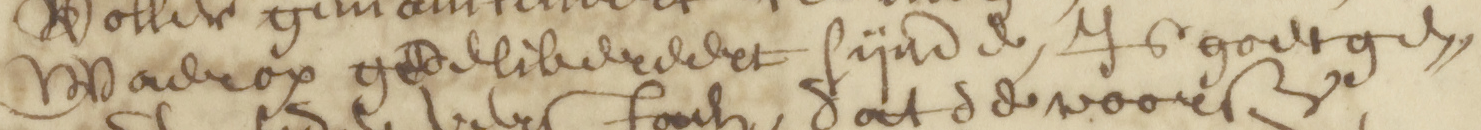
Waerop gedelibereert sijnde, Is goetge,,
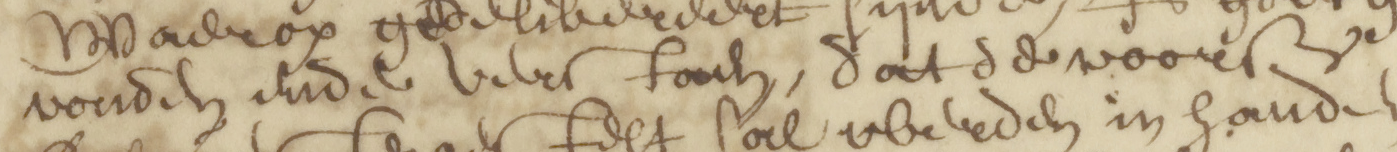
vonden ende verstaen, dat de voors
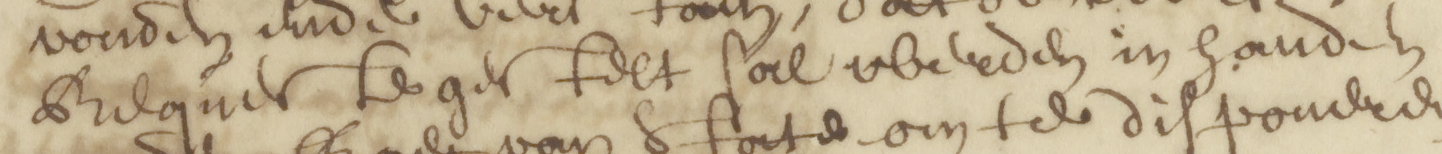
Requeste gestelt sal werden in handen
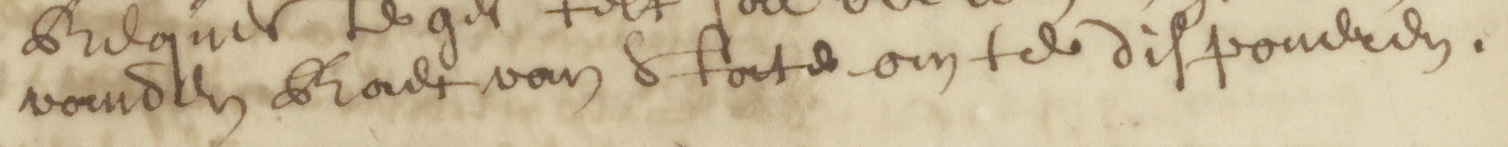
vanden Raet van State, om te disponeren.
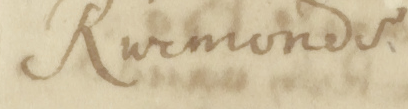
Rurmonde
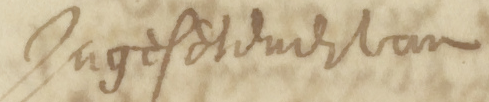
Ingesetenen van
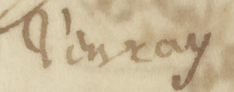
Venray
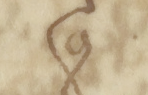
ca.
